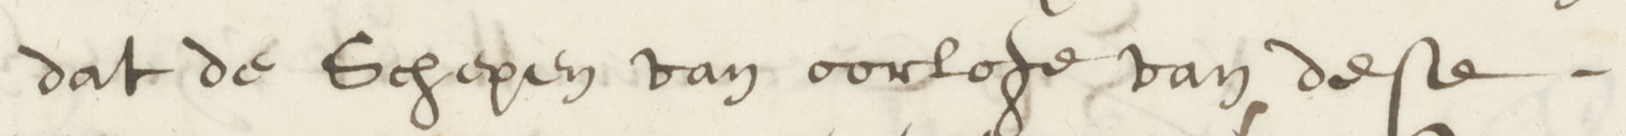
dat de Schepen van oorloge van dese
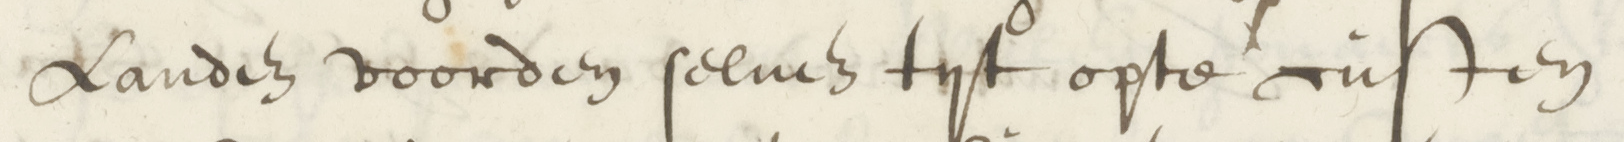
Landen voorden seluen tyt opte custen
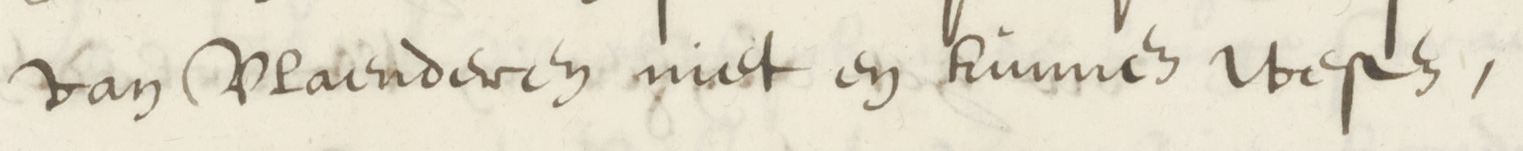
van Vlaenderen niet en kunnen wesen.
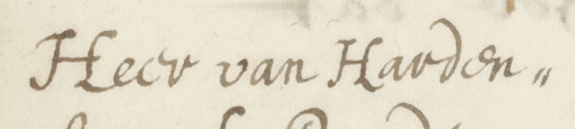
Heer van Harden,,
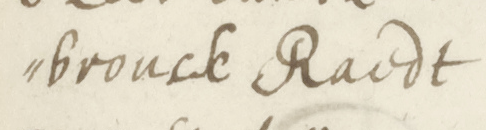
,,brouck Raedt
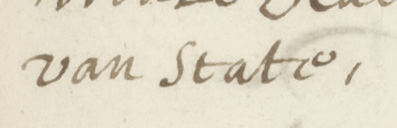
van State.
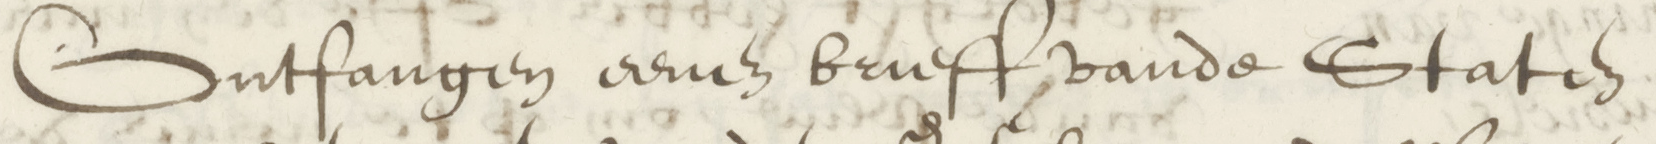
Ontfangen eenen brieff vande Staten
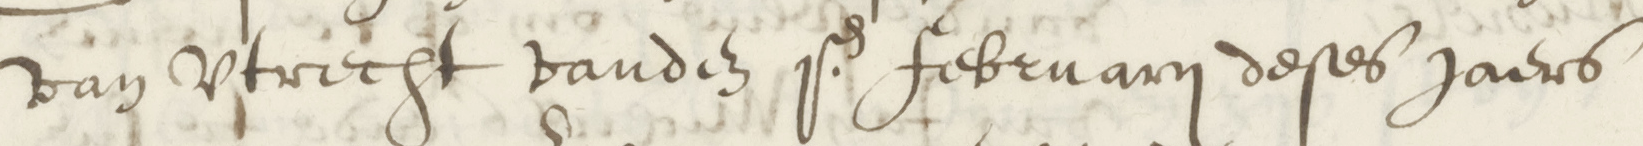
van Utrecht vanden 1en february deses jaers
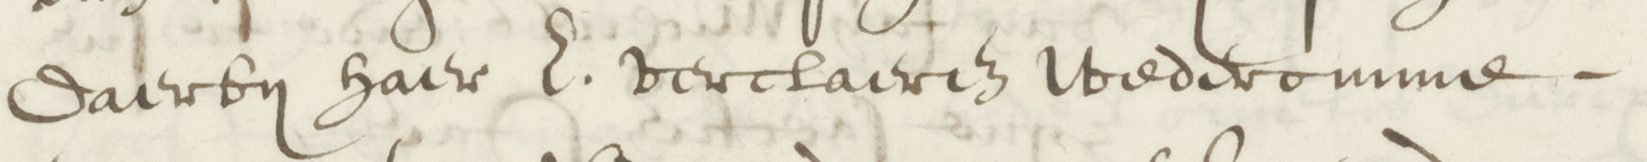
Daerby haer E. verclaeren wederomme -
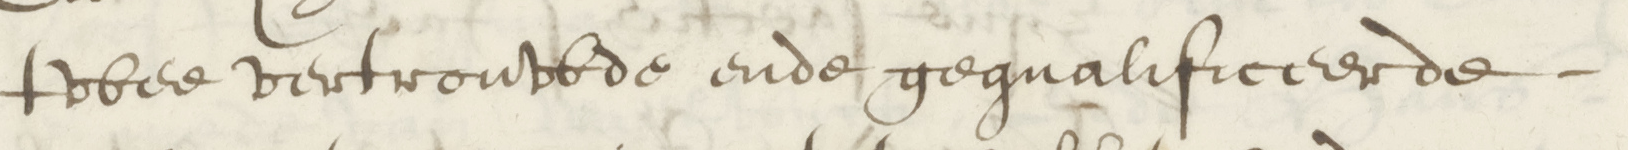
twee vertrouwde ende gequalificeerde
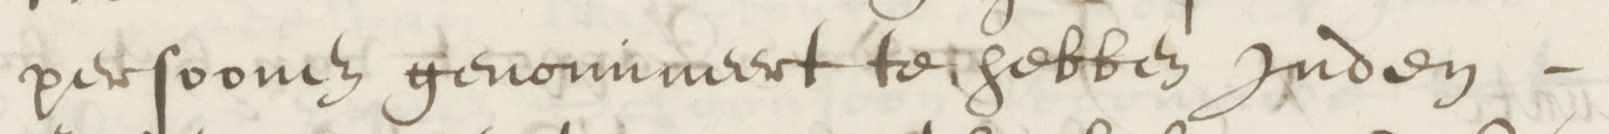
persoonen genomineert te hebben Inden -
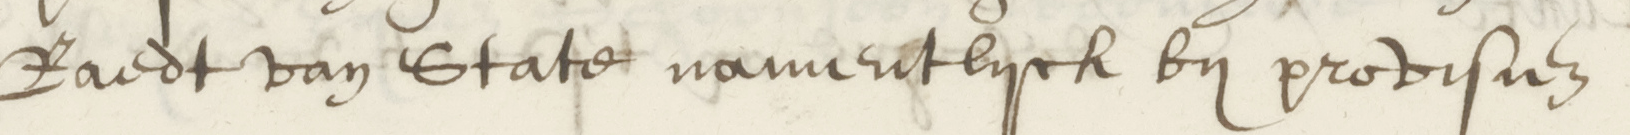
Raedt van State namentlyck by provisien
